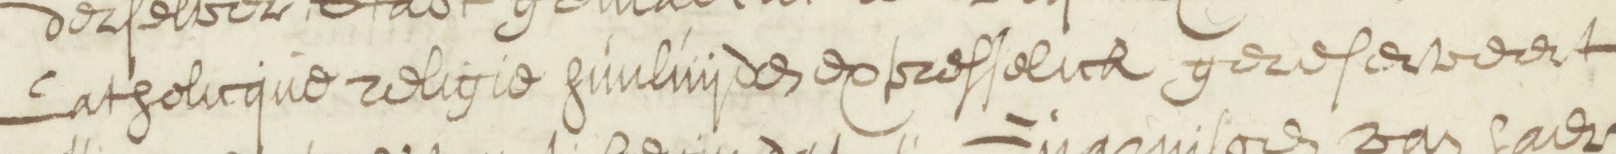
Catholicque religie hunluijden expresselick gereserveert
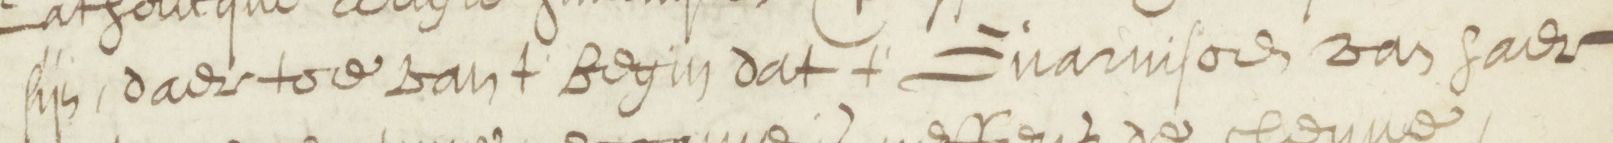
sijn, daertoe vant' begin dat t' Guarnisoen van haer
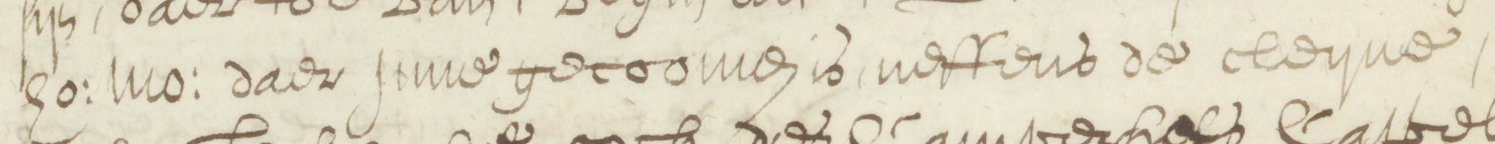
ho:mo: daer Inne gecoomen is, neffens de cleyne
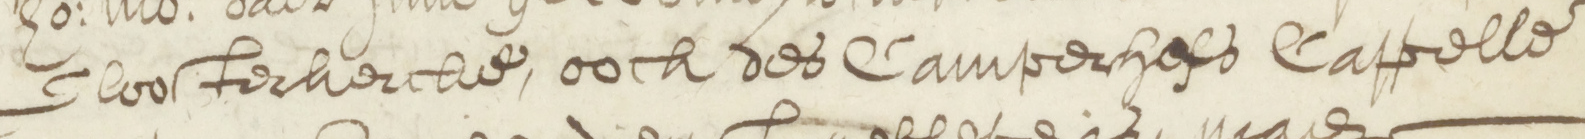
Cloosterkercke, oock des Camperhofs Capelle
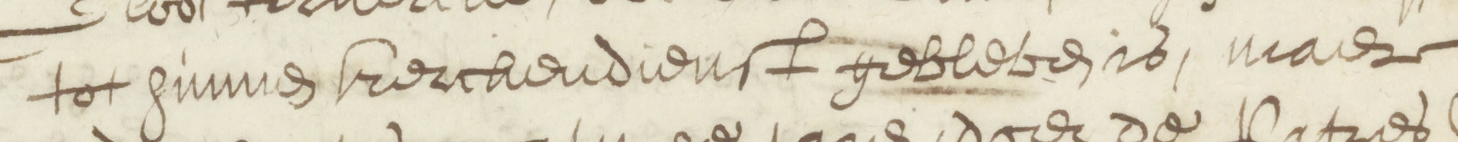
tot hunnen kerckendienst gebleven is, maer
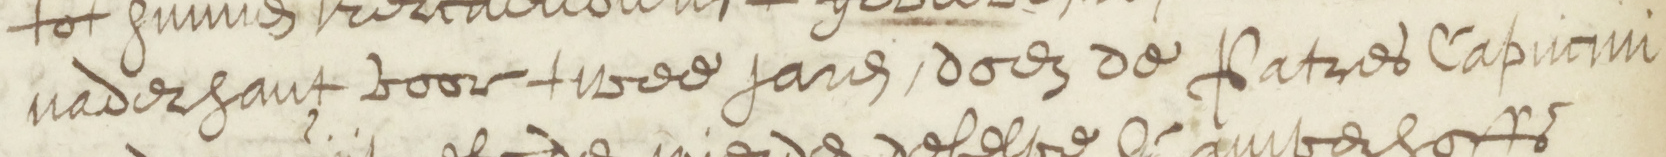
naderhant voor twee jaren, doen de Patres Capucini
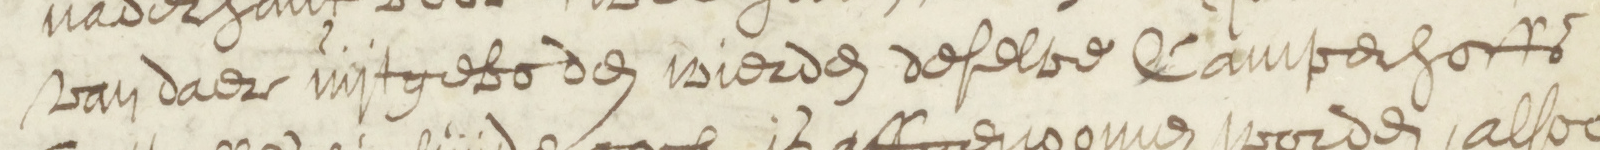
van daer uijtgeboden wierden deselve Camperhoffs
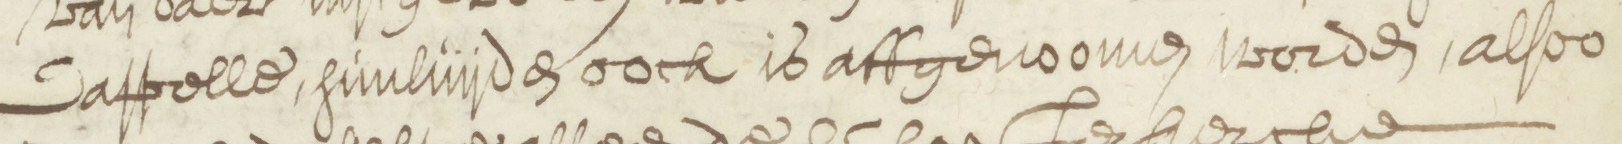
Capelle, hunluijden oock is affgenoomen worden, alsoo
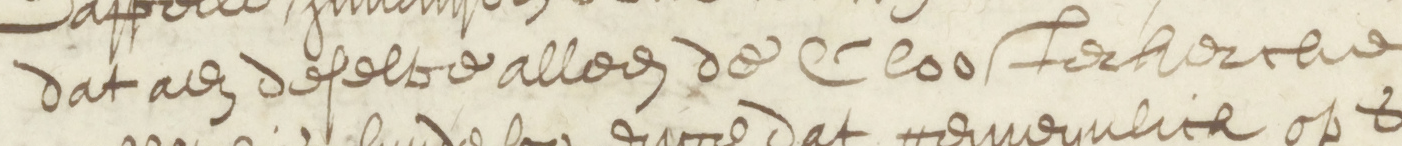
dat aen deselve alleen de Cloosterkercke
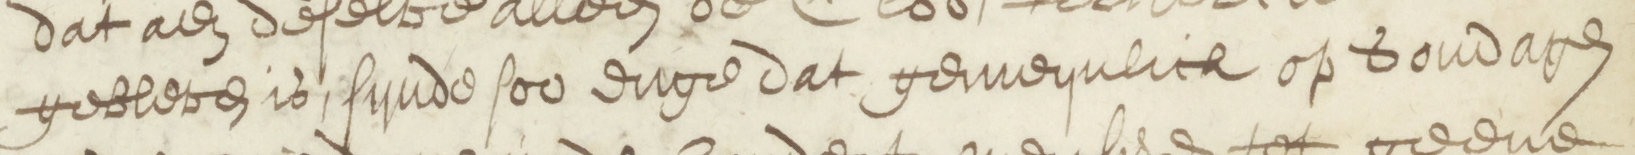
gebleven is, synde soo enge dat gemeynlick op Sondagen
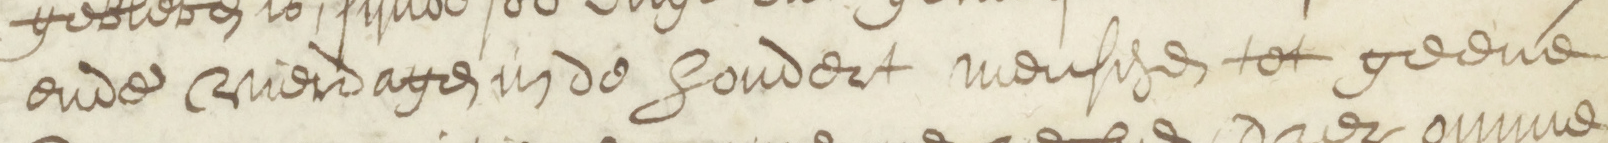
ende vierdagen in de hondert menschen tot geene
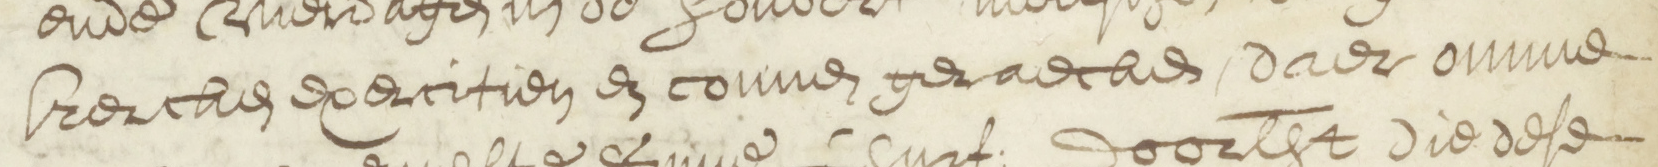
kercken exercitien en connen geraecken, daer omme
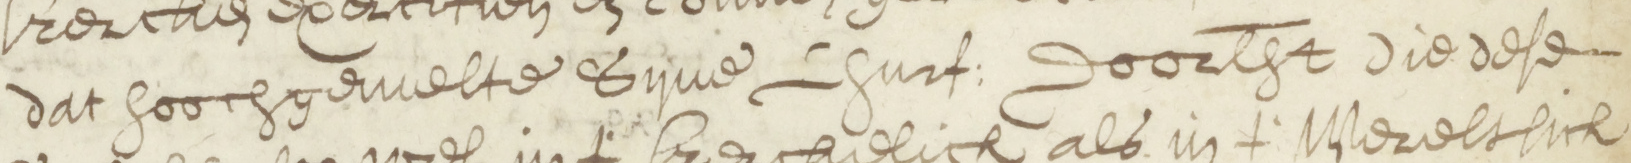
dat hoochgemelte Sijne Churf: Doorlht die dese
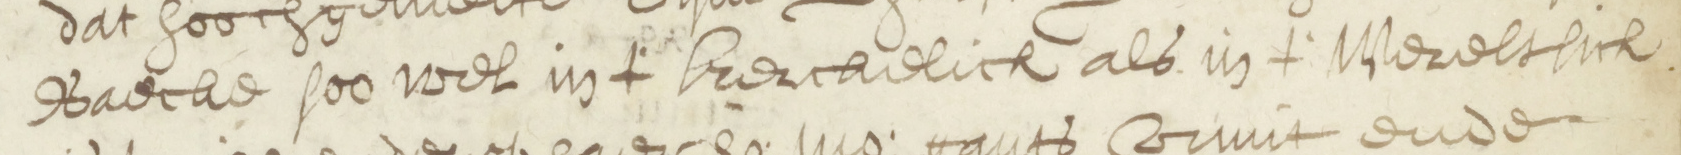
Saecke soo wel in t' kerckelick als in t' Wereltlick
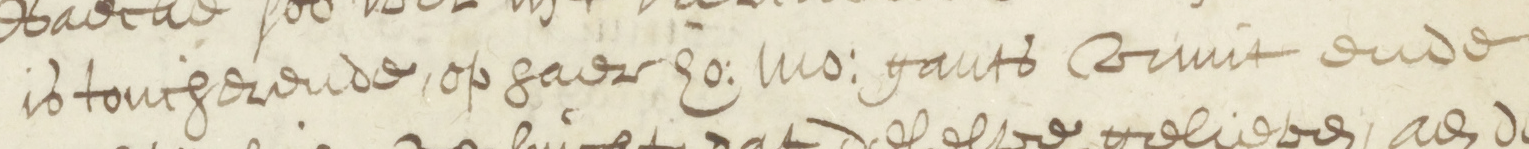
is toucherende, op haer ho:mo: gants vrunt ende
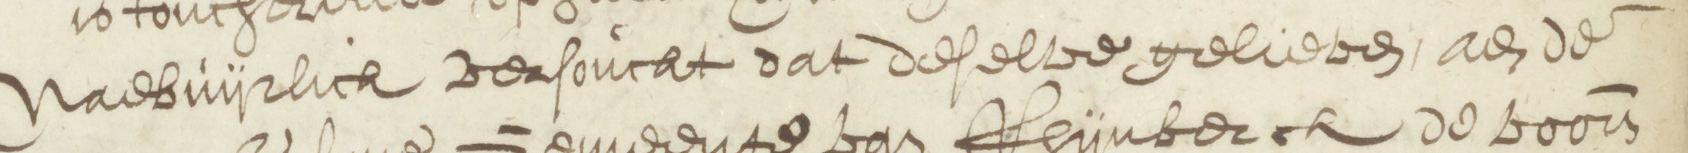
Naebuijrlick versouckt dat deselve gelieven, aen de
